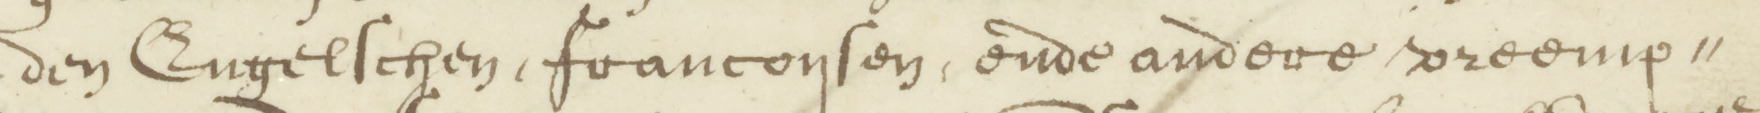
den Engelschen, Francoysen, ende andere vreemp„
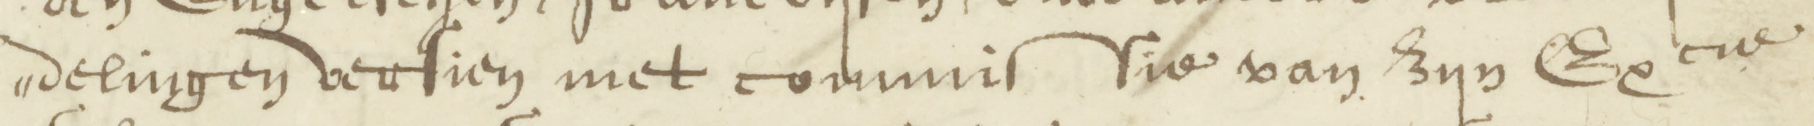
,,delingen versien met commissie van zyn Excie
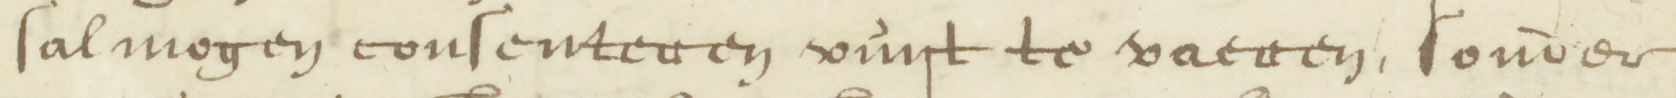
sal mogen consenteren vuyt te vaeren, sonder
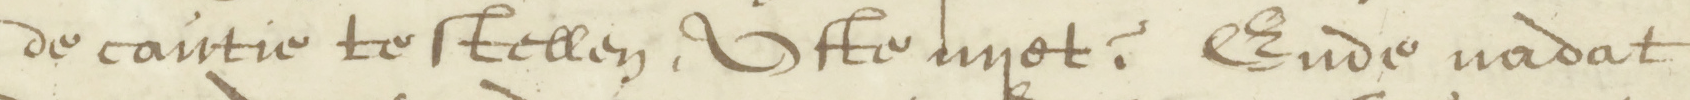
de cautie te stellen, Ofte nyet. Ende nadat
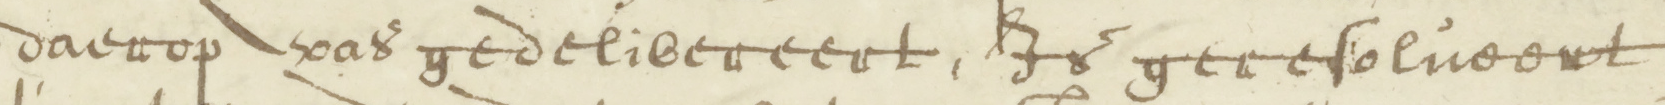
daerop was gedelibereert, Is geresolueert
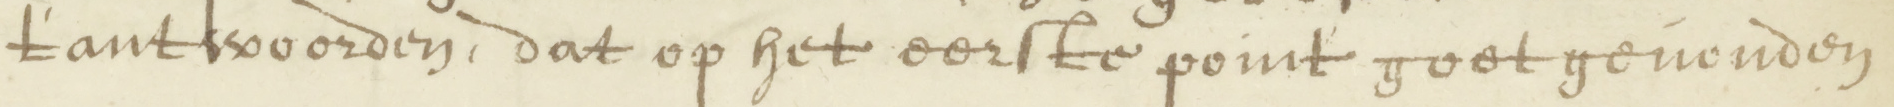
t'antwoorden, dat op het eerste point goetgeuonden
